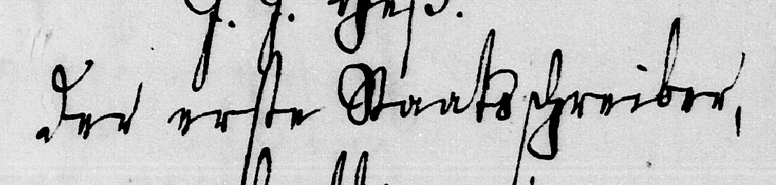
Der erste Staatsschreiber,
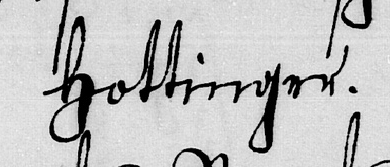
Hottinger.
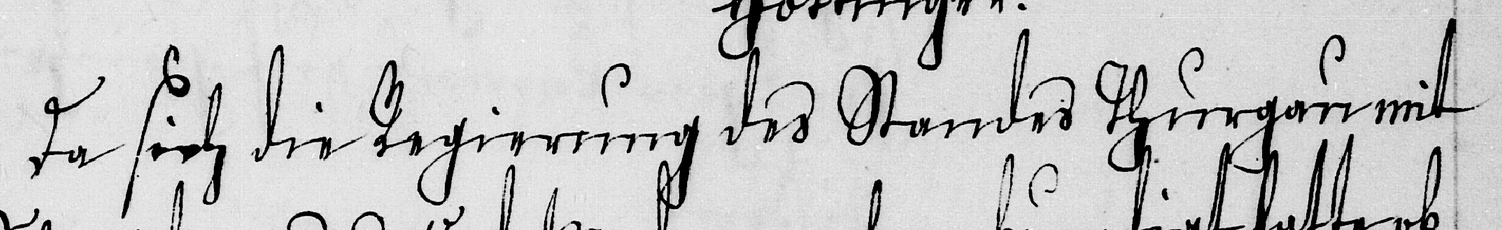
Da sich die Regierung des Standes Thurgau mit
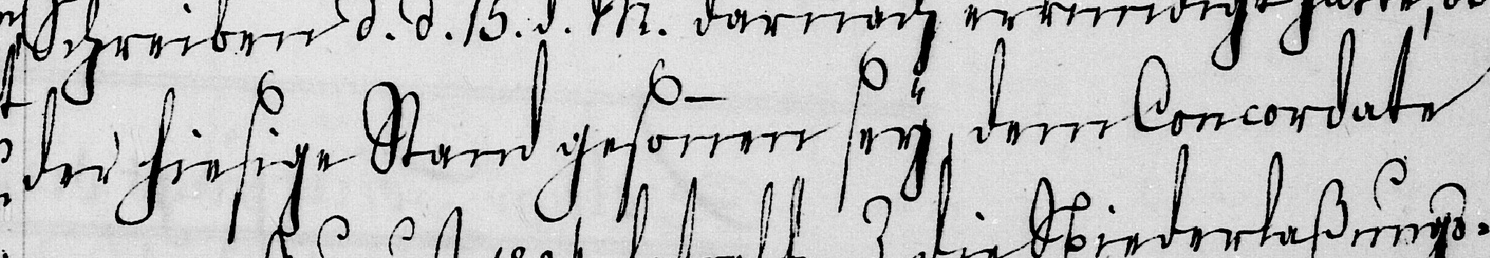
der hiesige Stand gesonnen sey, dem Concordate
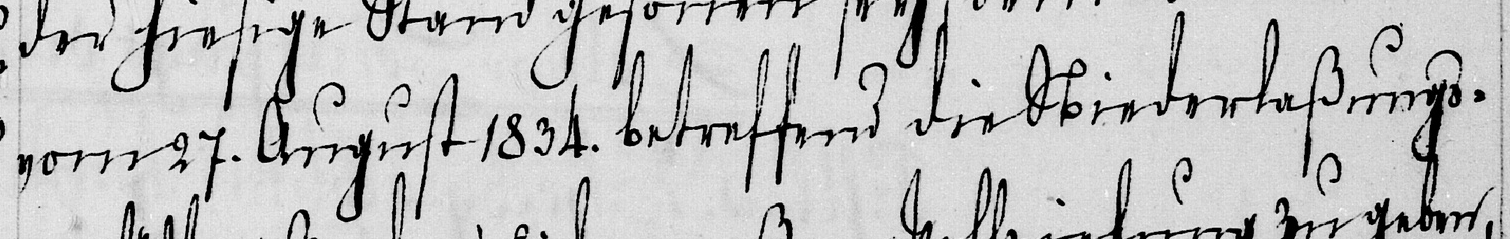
vom 27. August 1834. betreffend die Niederlaßungs¬
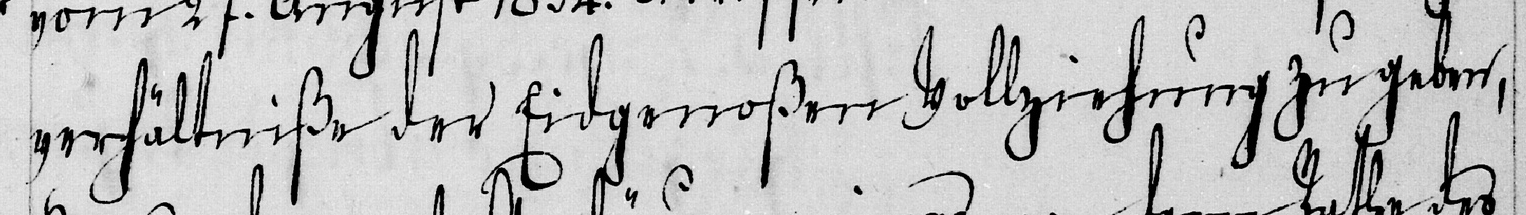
verhältniße der Eidgenoßen Vollziehung zu geben,
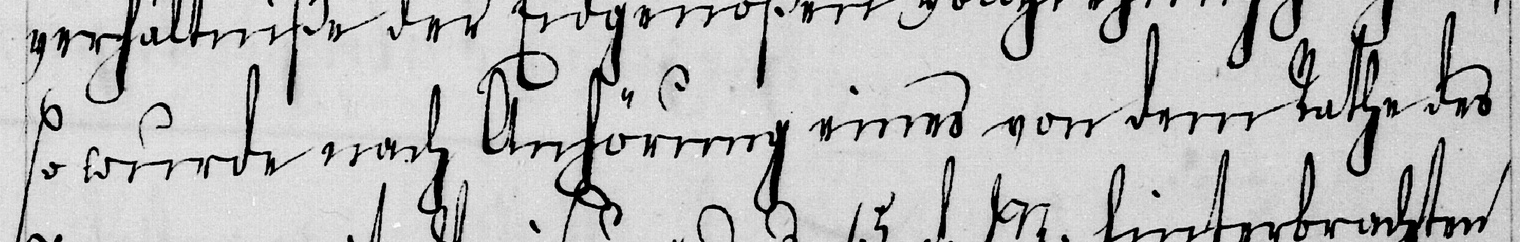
so wurde nach Anhörung eines von dem Rathe des
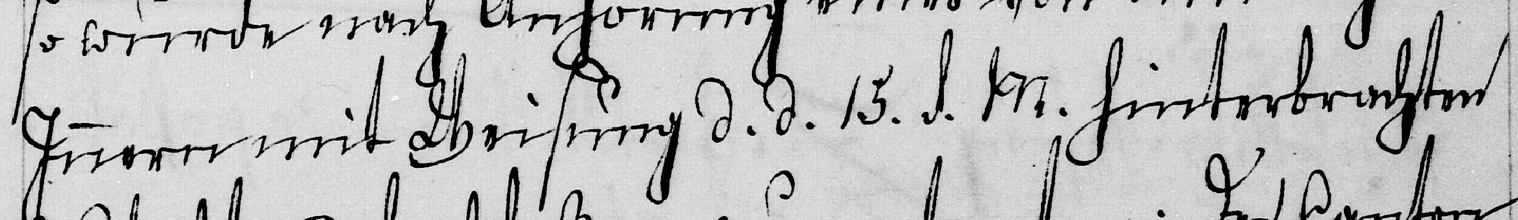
Innern mit Weisung d. d. 15. d. M. hinterbrachten
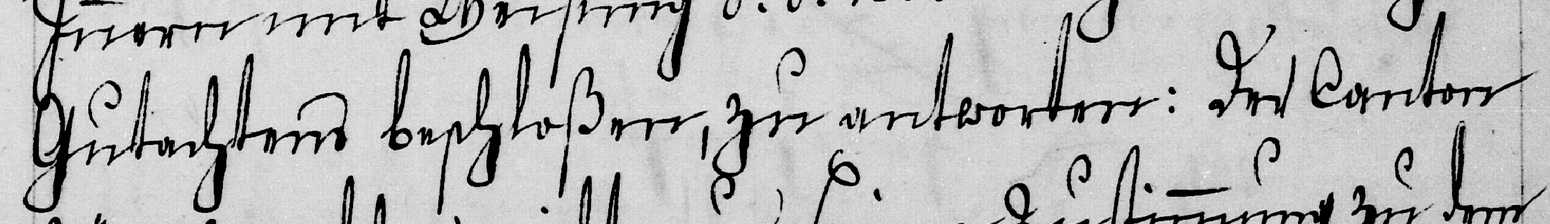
Gutachtens beschloßen, zu antworten: Der Canton
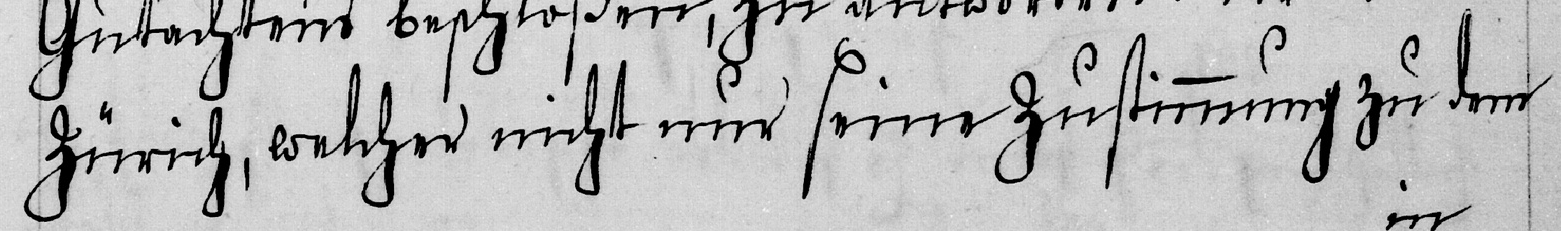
Zürich, welcher nicht nur seine Zustimmung zu dem
